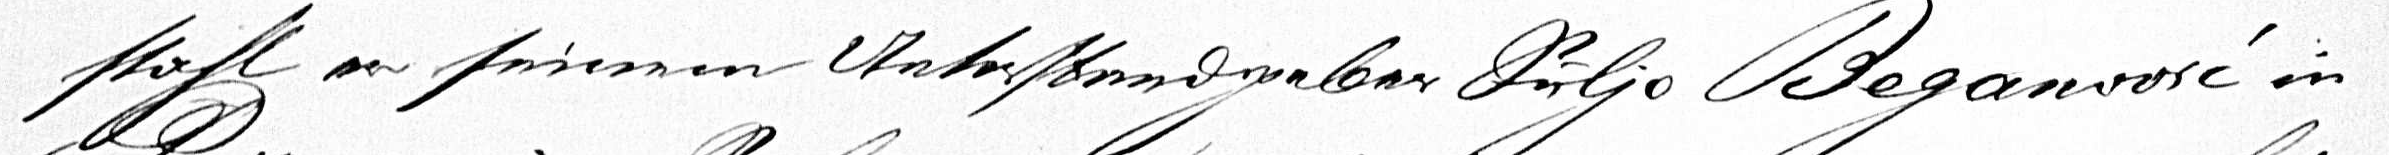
stahl er seinem Unterstandgeber Suljo Beganović in
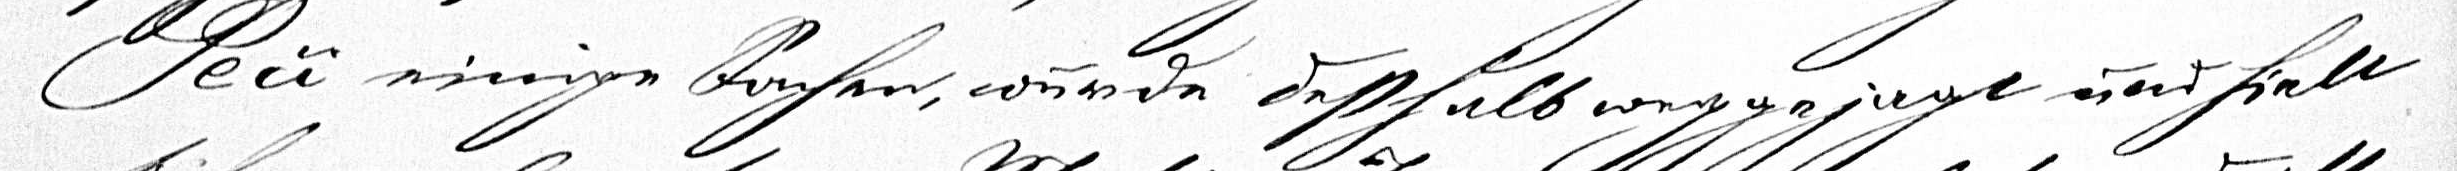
Peü einige Sachen, wurde deßhalb weggejagt und hielt
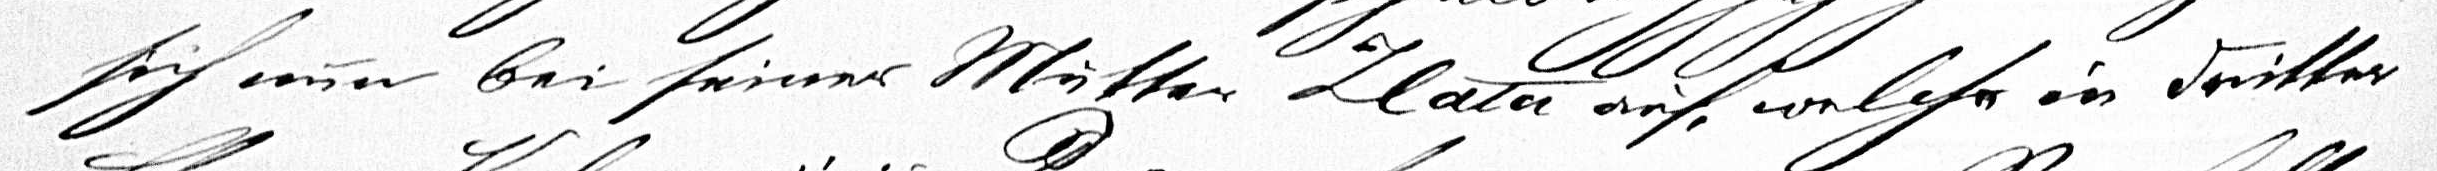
sich nun bei seiner Mutter Zlata auf, welche in dritter
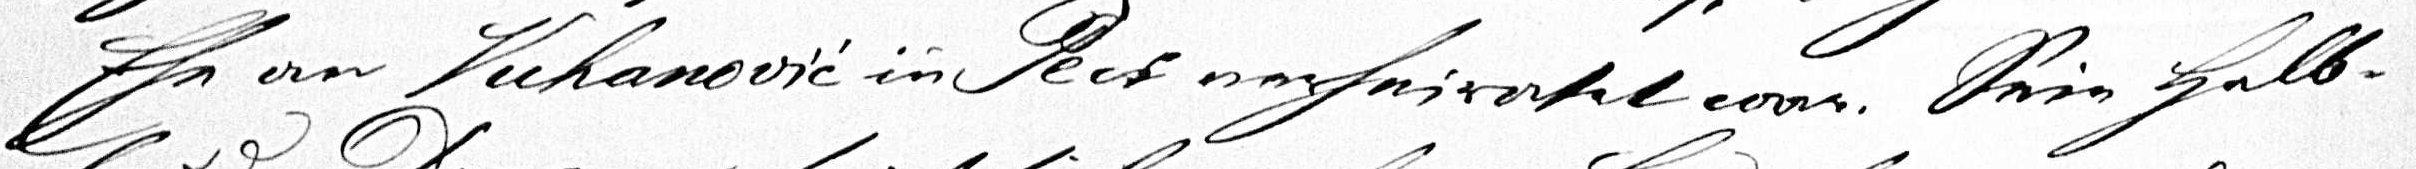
Ehe an Vuhanović in Peu verheiratet war. Sein Halb¬
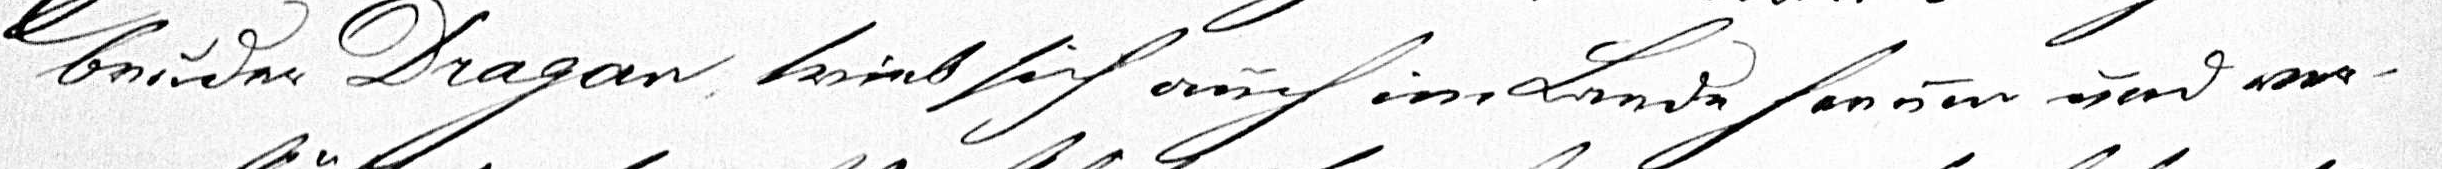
bruder Dragan, trieb sich auch im Lande herum und ver¬
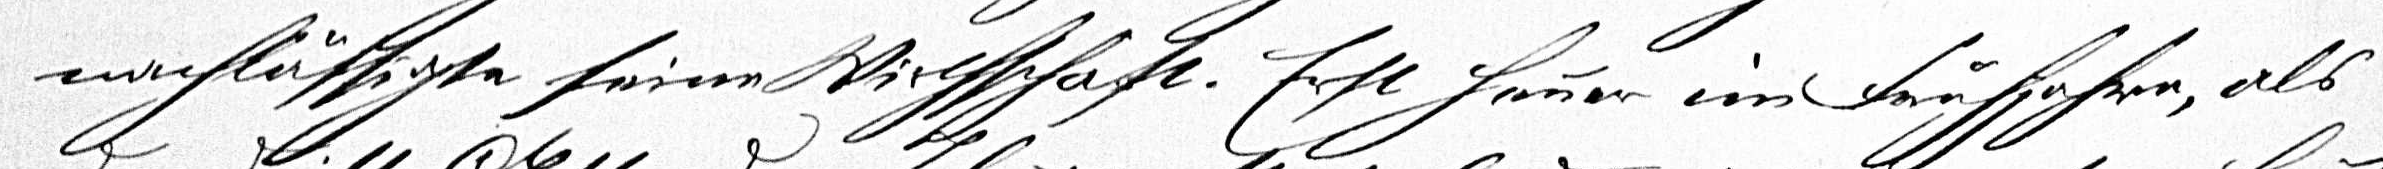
nachlässigte seine Wirtschaft. Erst heuer im Frühjahre, als
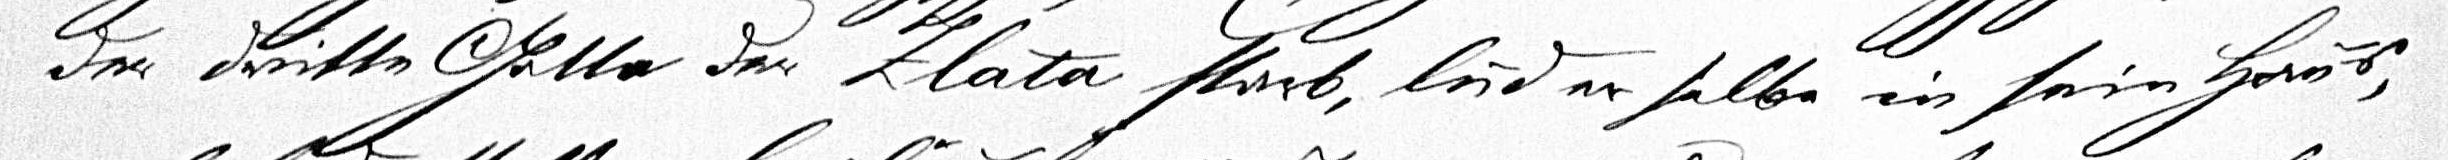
der dritte Gatte der Zlata starb, lud er selbe in sein Haus,
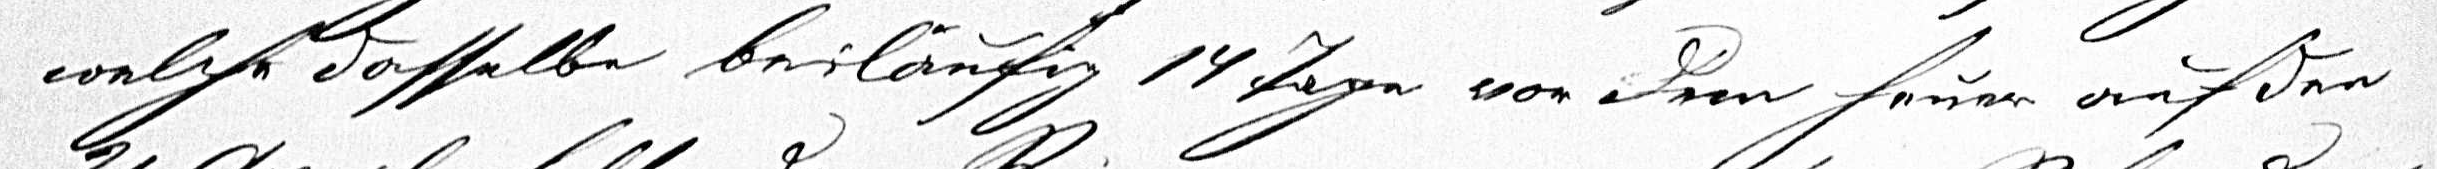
welche dasselbe beiläufig 14 Tage vor dem Heuer auf den
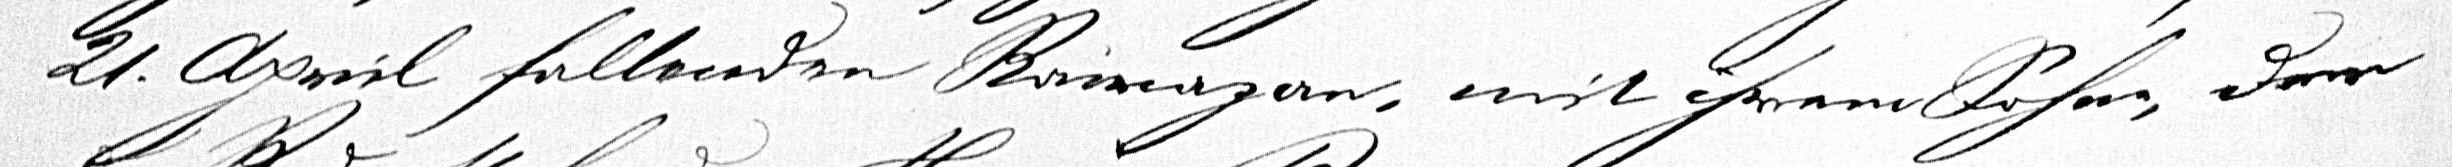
21. April fallenden Rairazan, mit ihrem Sohne, der
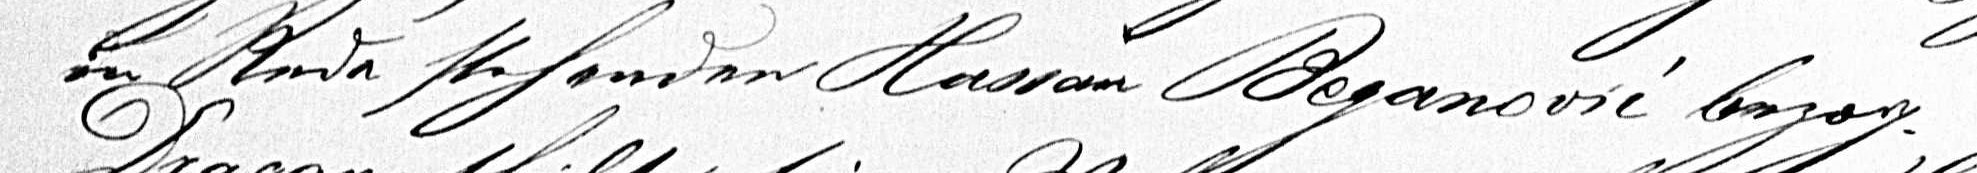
in Rede stehenden Hassan Beganović bezog.
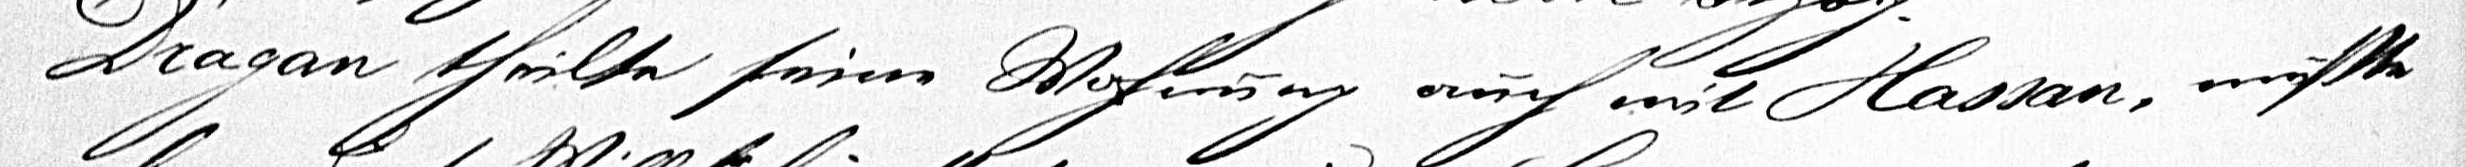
Dragan theilte seine Wohnung auch mit Hassan, mußte
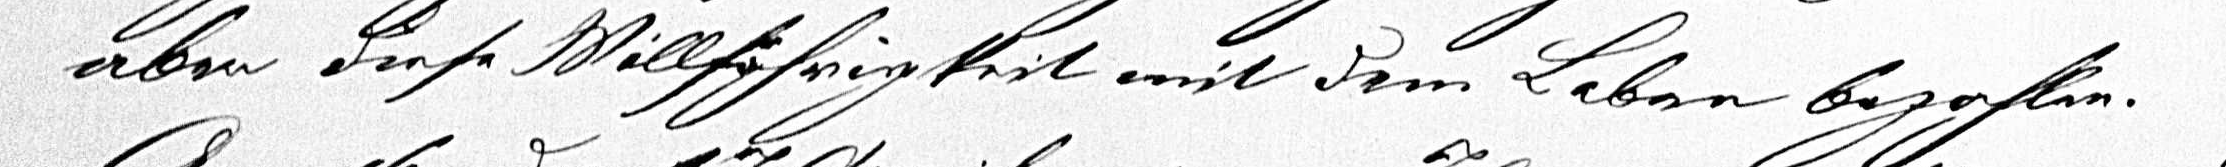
aber diese Willführigkeit mit dem Leben bezahlen.
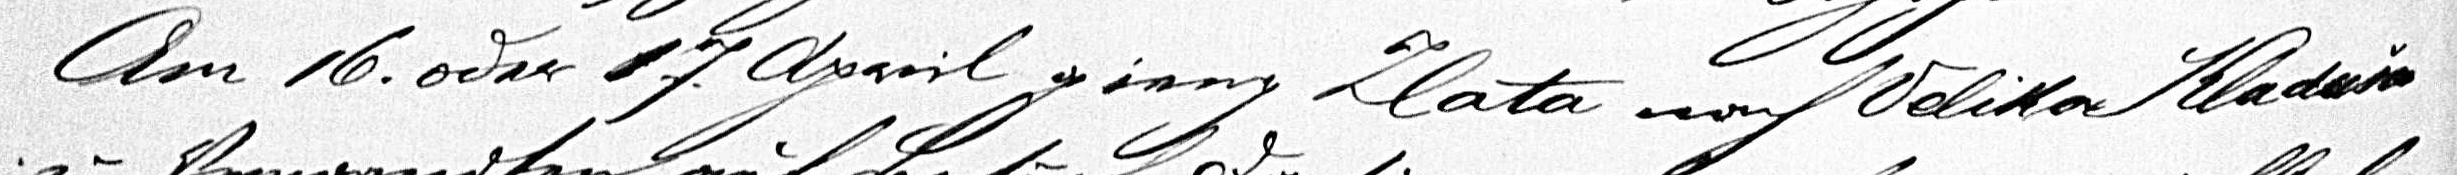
Am 16. oder 17. April gieng Zlata nach Velika Kladxx
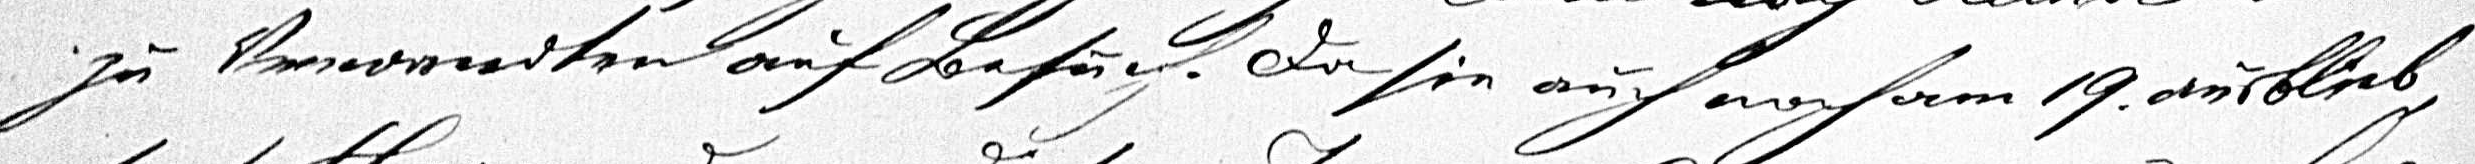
zu Verwandten auf Besuch. Da sie auch noch am 19. ausblieb
